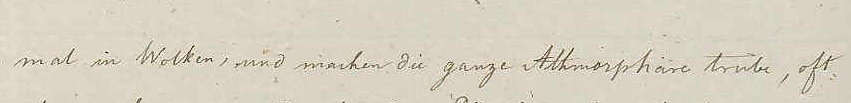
mal in Wolken, und machen die ganze Athmosphäre trübe, oft
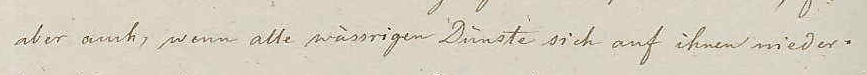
aber auch, wenn alle wässrigen Dünste sich auf ihnen nieder-
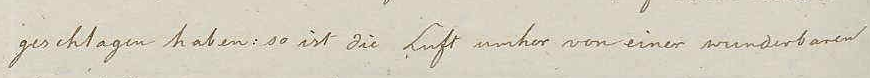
geschlagen haben: so ist die Luft umher von einer wunderbaren
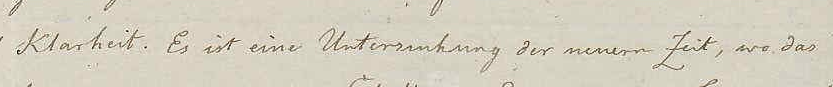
Klarheit. Es ist eine Untersuchung der neuern Zeit, wo das
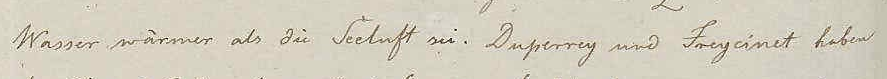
Wasser wärmer als die Seeluft sei. Duperrey und Freycinet haben
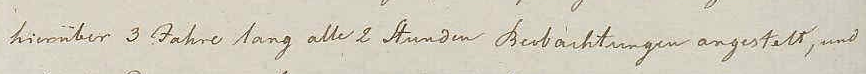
hierüber 3 Jahre lang alle 2 Stunden Beobachtungen angestelt, und
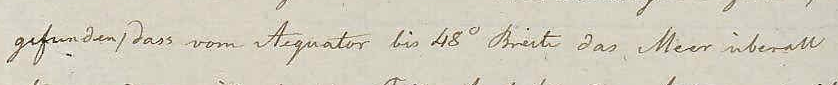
gefunden, dass vom Aequator bis 48° Breite das Meer überall
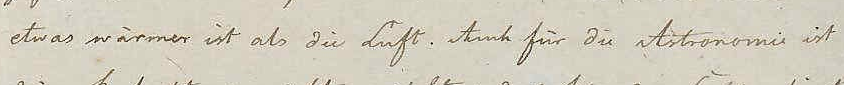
etwas wärmer ist als die Luft. Auch für die Astronomie ist
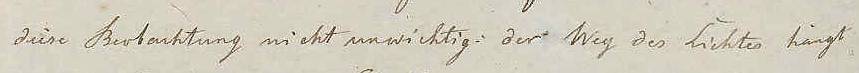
diese Beobachtung nicht unwichtig: der Weg des Lichtes hängt
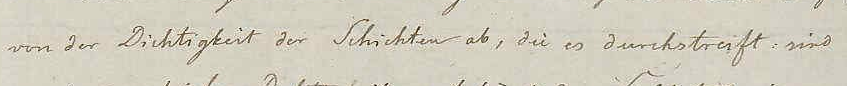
von der Dichtigkeit der Schichten ab, die es durchstreift: sind
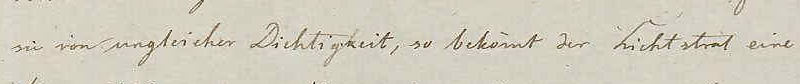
sie von ungleicher Dichtigkeit, so bekömt der Lichtstral eine
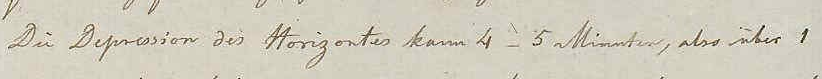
Die Depression des Horizontes kann 4–5 Minuten, also über 1
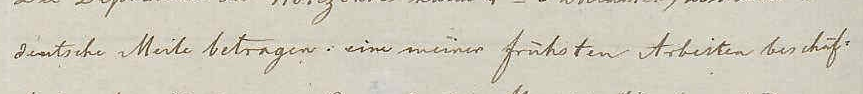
deutsche Meile betragen: eine meiner frühesten Arbeiten beschäf-
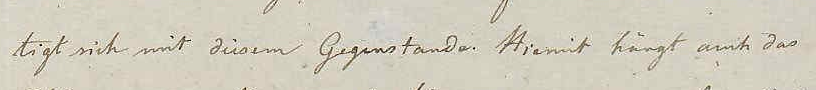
tigt sich mit diesem Gegenstande. Hiemit hängt auch das
